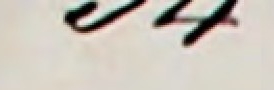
???
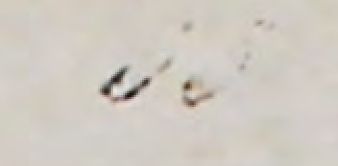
???
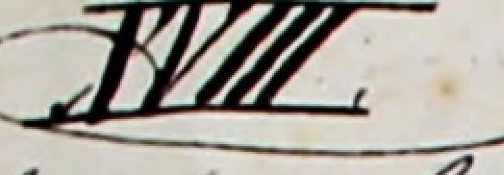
XVIII
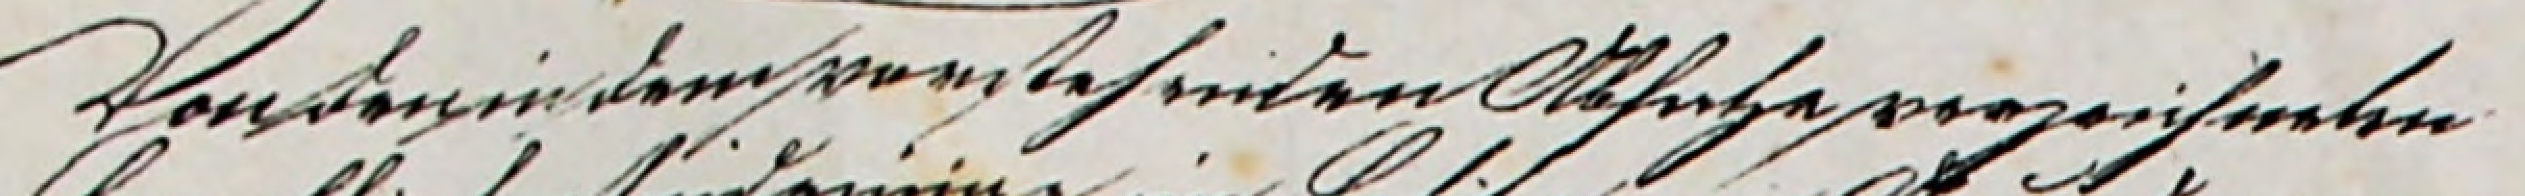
Von den in dem vorstehenden Absatze verzeichneten
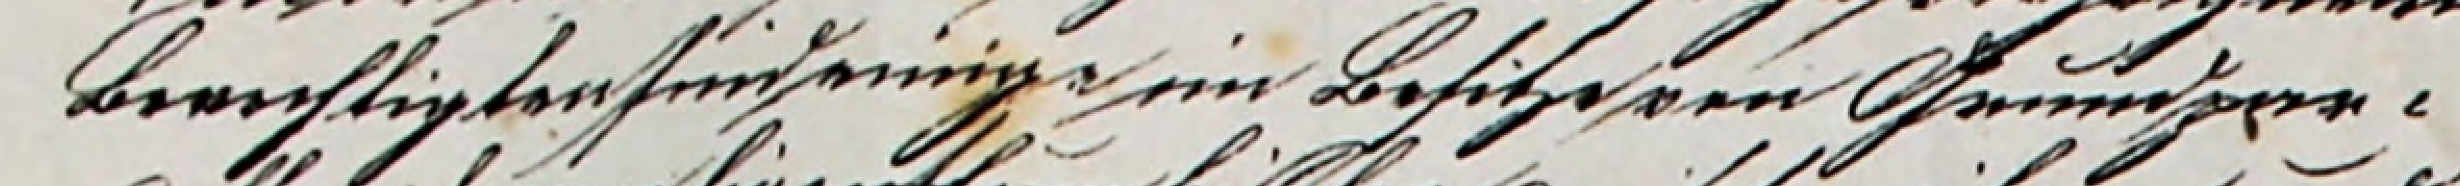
Berechtigten sind einige im Besitze von Grundpar„
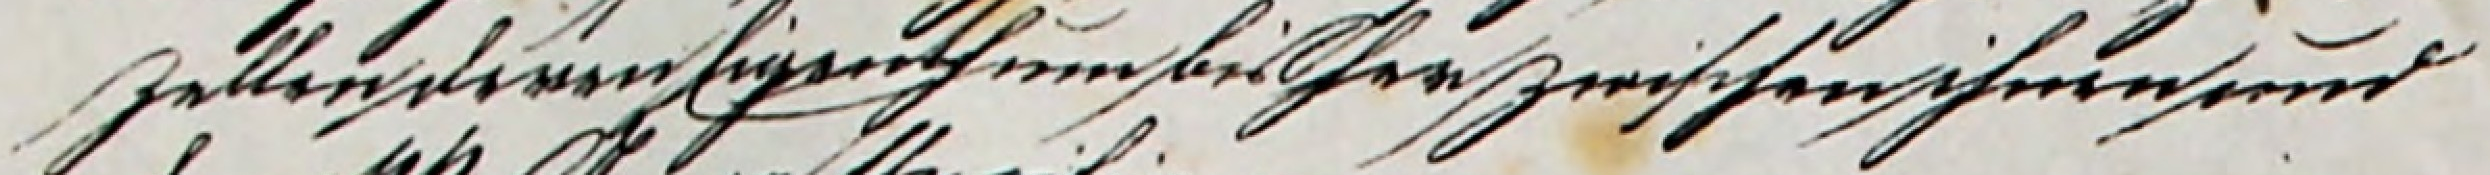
zellen deren Eigenthum bisher zwischen ihnen und
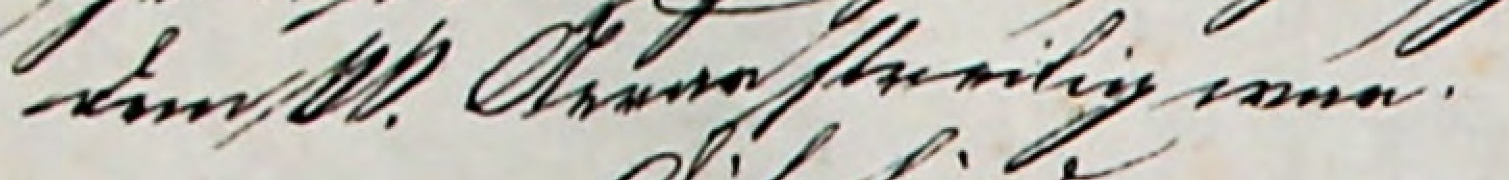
dem kk. Aerar streitig war.
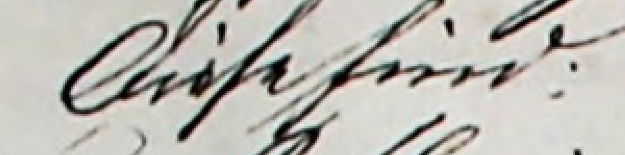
Diese sind:
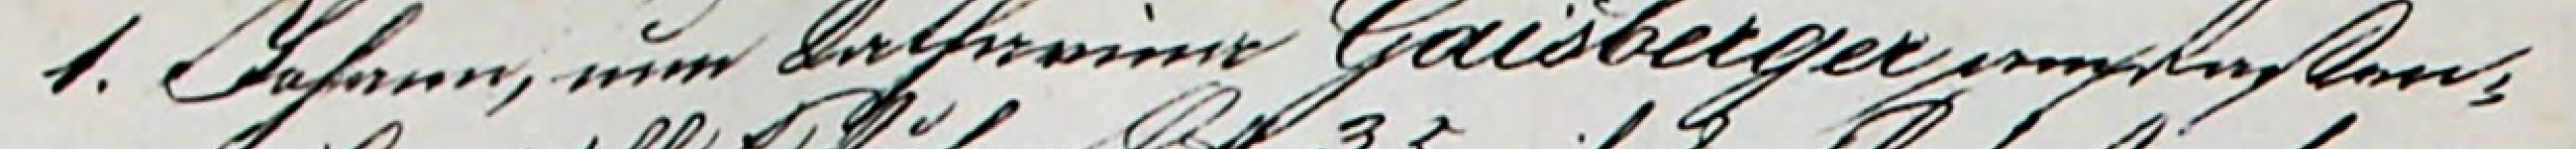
1. Johann, um Katharina Gaisberger am Rasten„
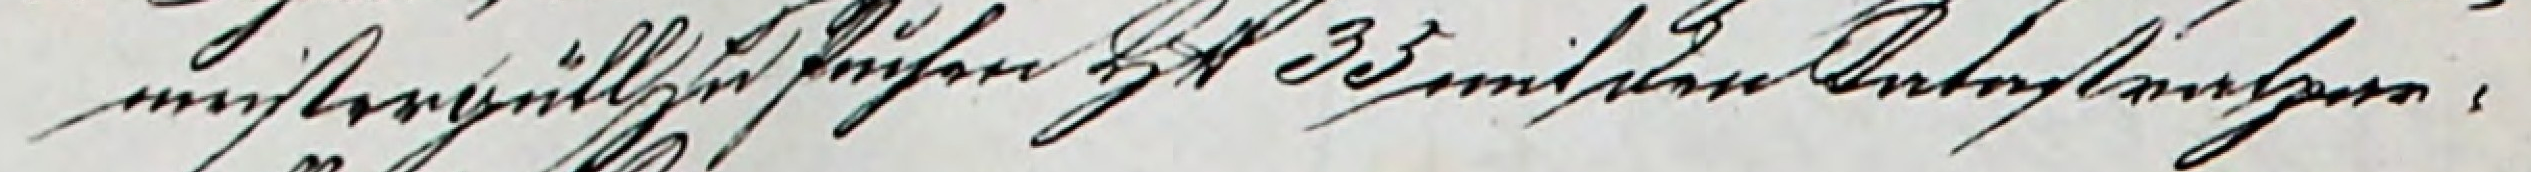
meistergült zu Puchen Htt 35 mit den Katastratpar„
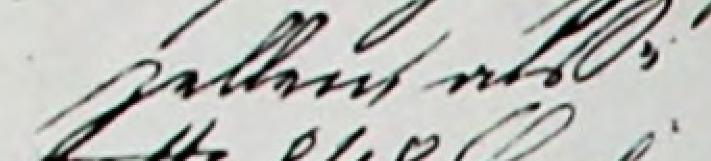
zellen als:
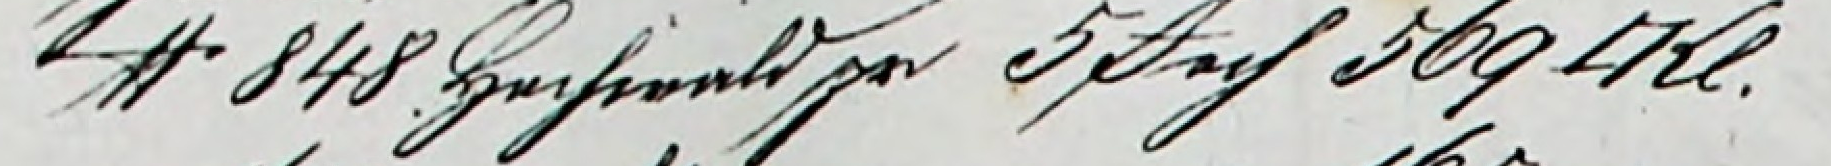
tt 848 Hochwald pr 5 Joch 569 Kl.
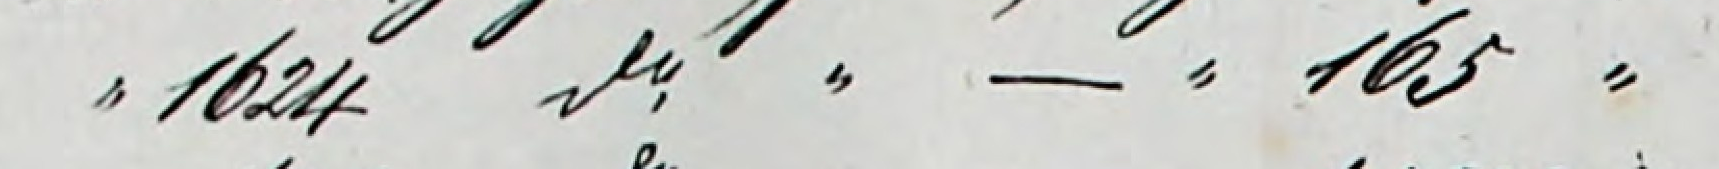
„ 1624 Do, „ „ 165 „
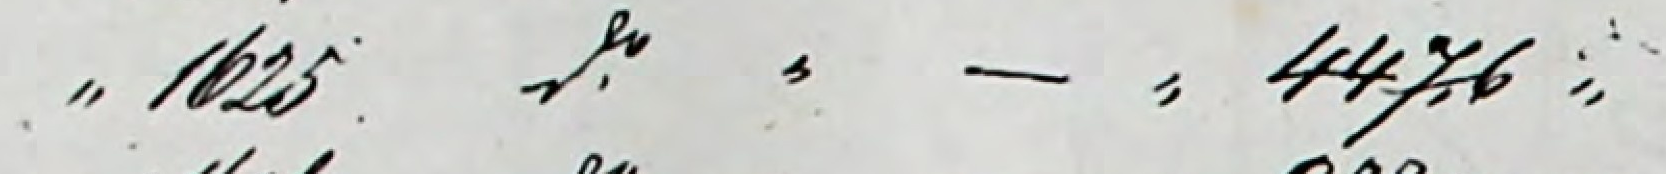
„ 1625 Do, „ „ 447,6 „
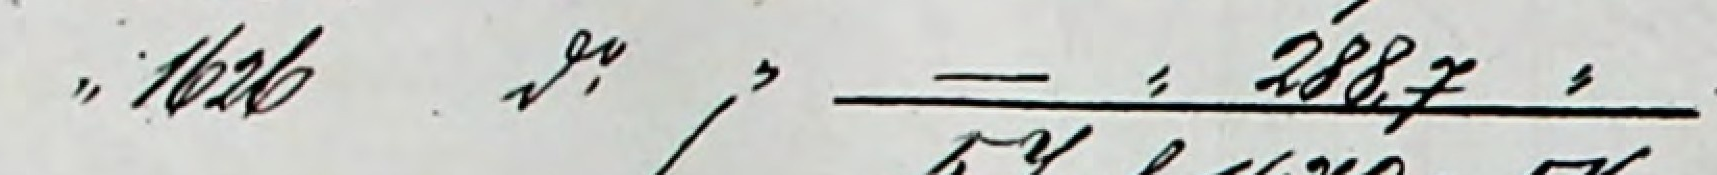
„ 1626 Do, „ „ 288,7 „
